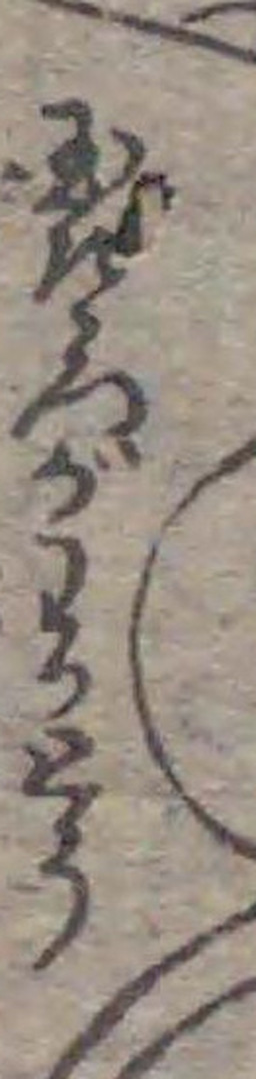国左衛門がわかとう
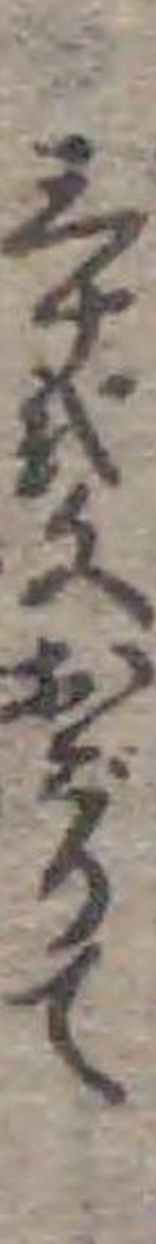三十弐文おごりて
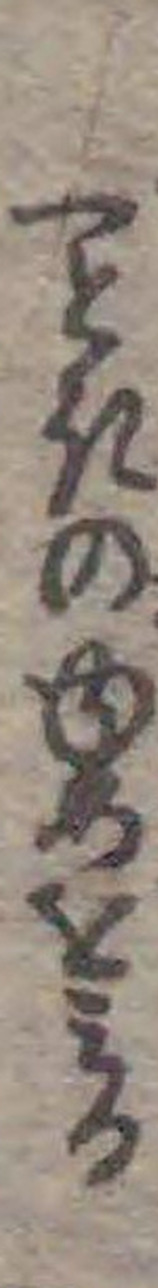一ときのゆめをみる
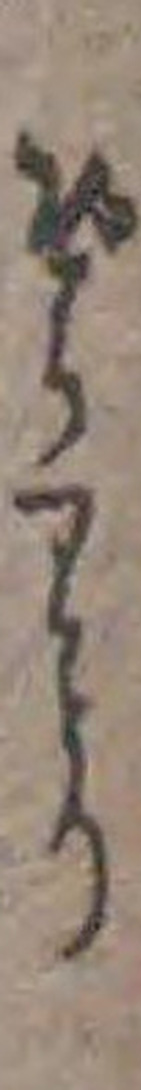ぞうりとり
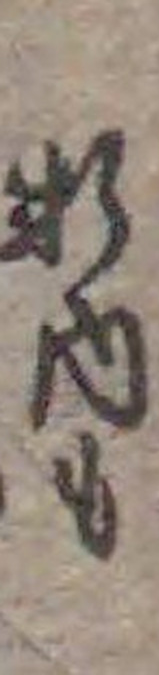折内も
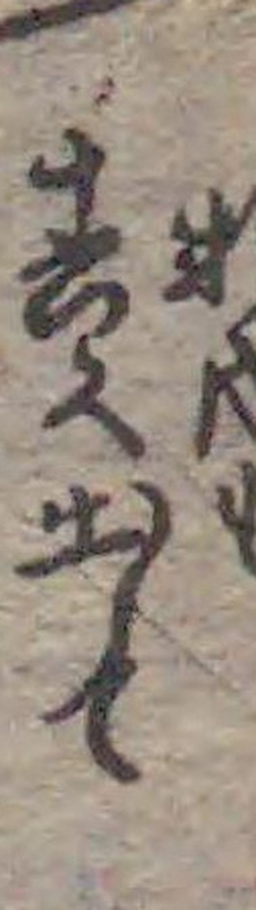十六文出して
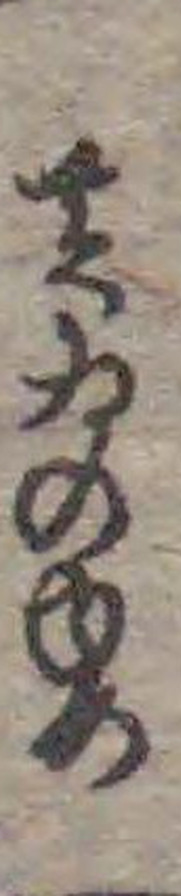芝ゐのゆめ
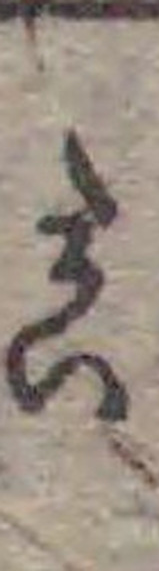たかい
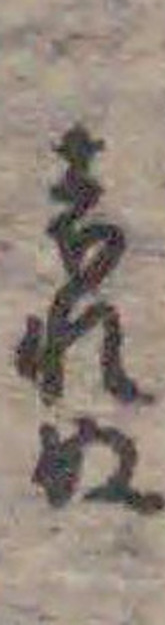しれぬ

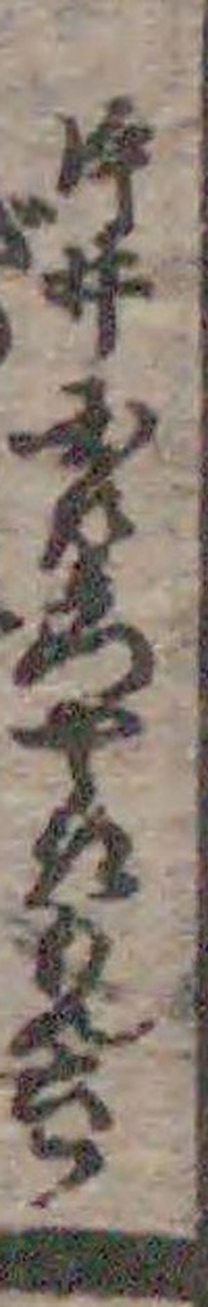片井国左衛門やきもん六ツ
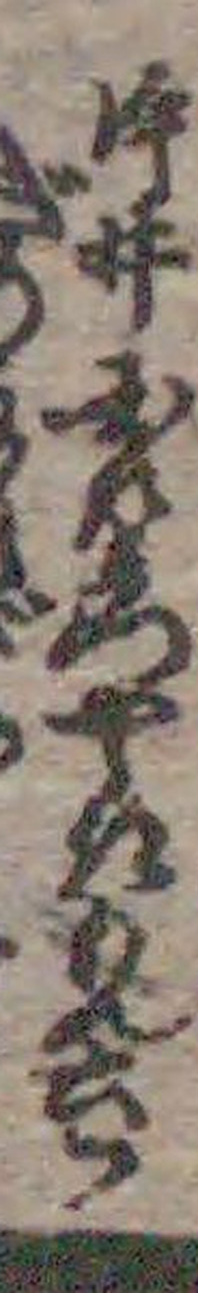片井国左衛門やきもん六ツ
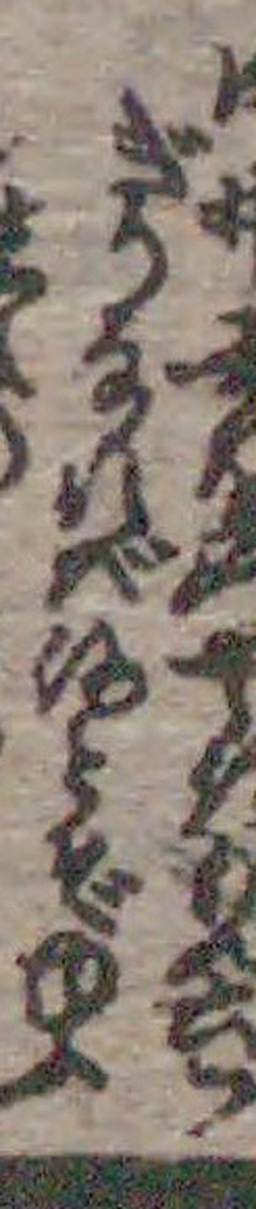ぎりなれば何とぞゆふ
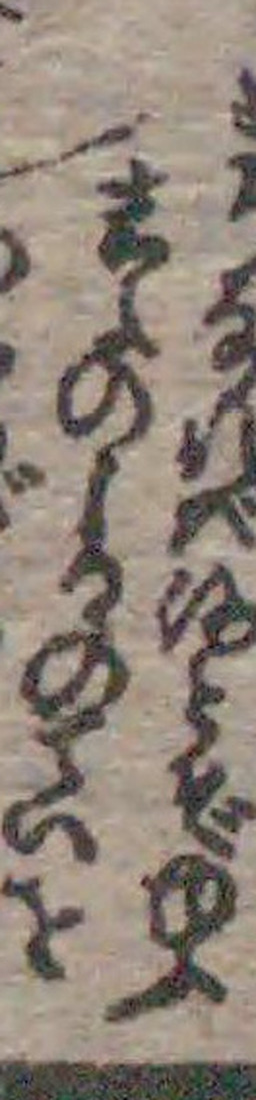しよのよるのていを
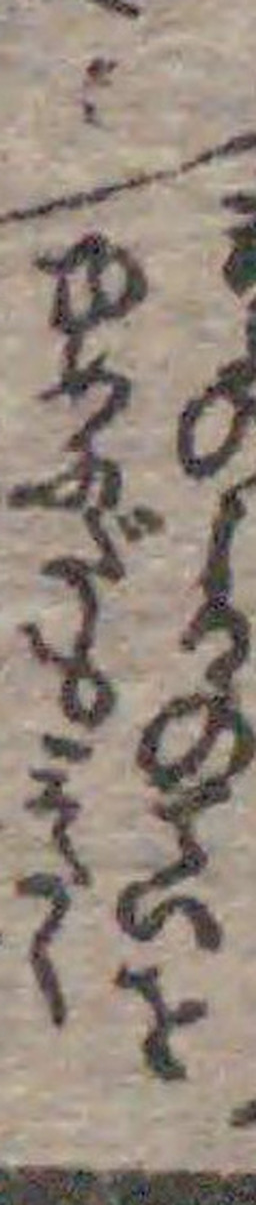ゆめだにもみたく
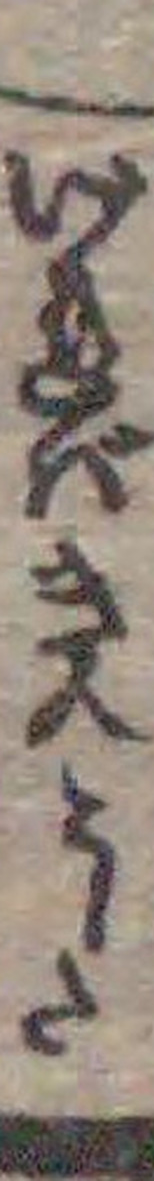ければきんとした
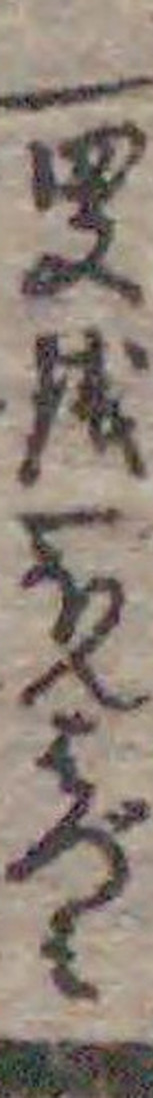四文銭一ほんはづみ
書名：見徳一炊夢 : 3巻
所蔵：国立国会図書館 National Diet Library, JAPAN
